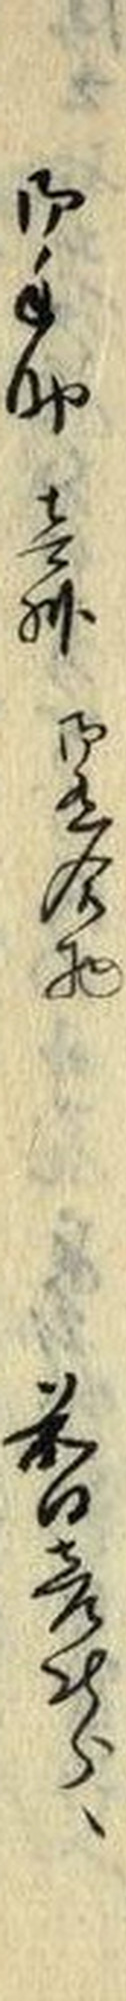御手助壱掛御有合物前田彦次郎へ
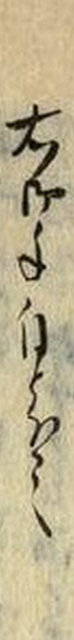右御手自被下之
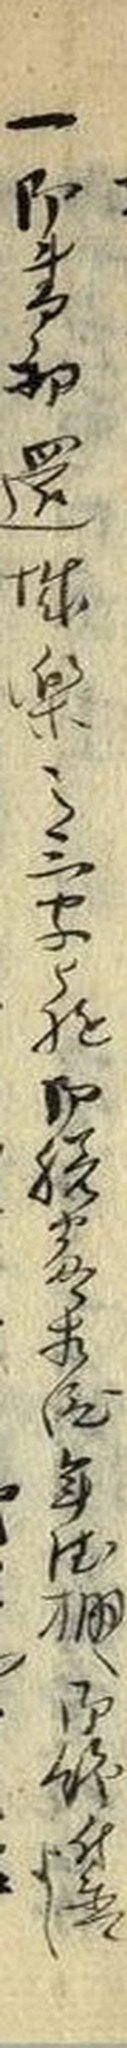一御書初還城楽之三字被遊御膳番へ相渡年徳棚へ御飾付置候よし
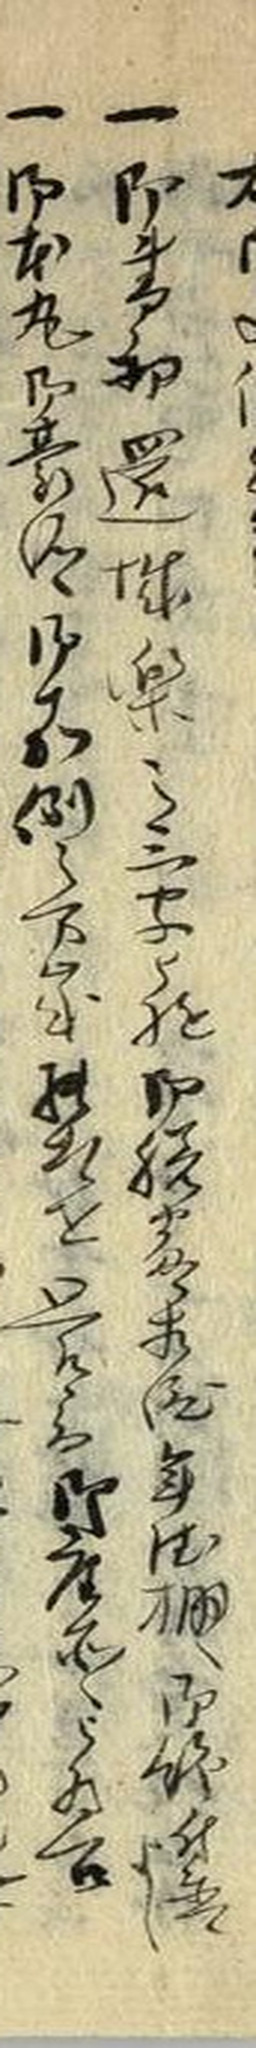一御本丸御台所へ御嘉例之万歳罷出候を思召ニ而御座所へ被為召
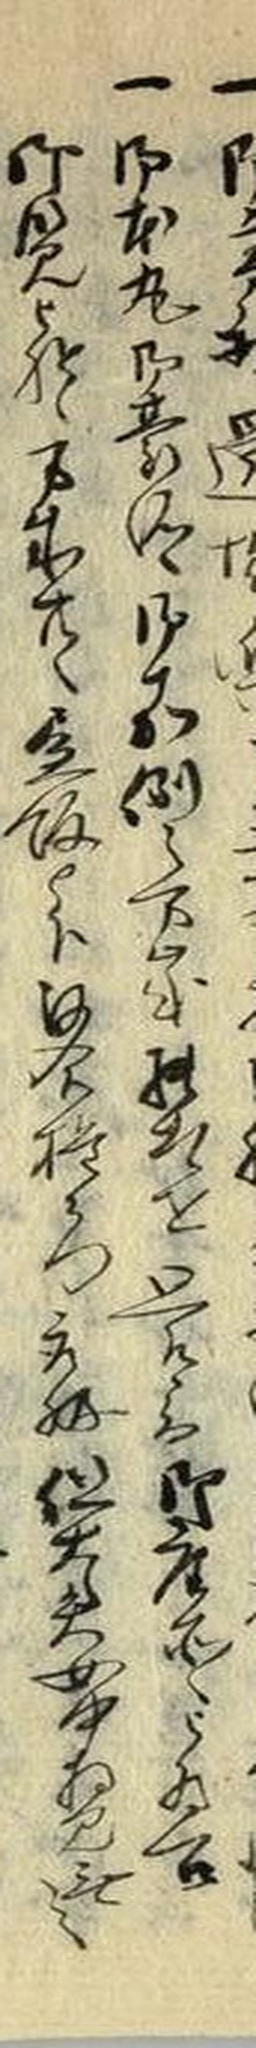御覧被遊候万歳共へ昼飯被下河合権左衛門取扱但大奥女中拝見無之
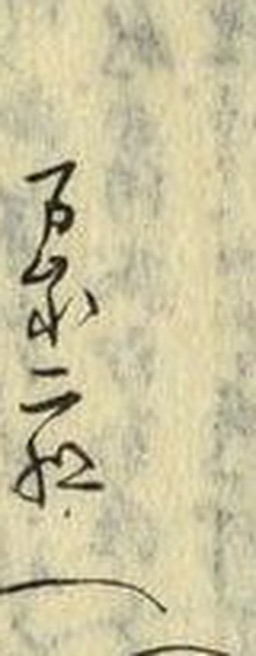万歳二組
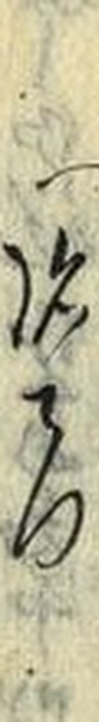弥右衛門
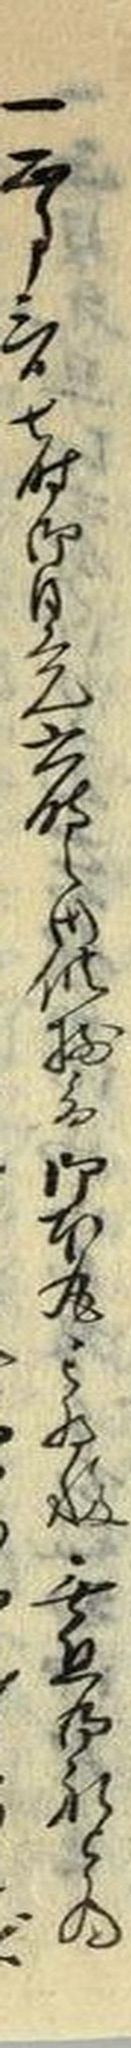一正月三日七時御目覚六時之御供揃ニ而御本丸へ被為移無息御礼被為
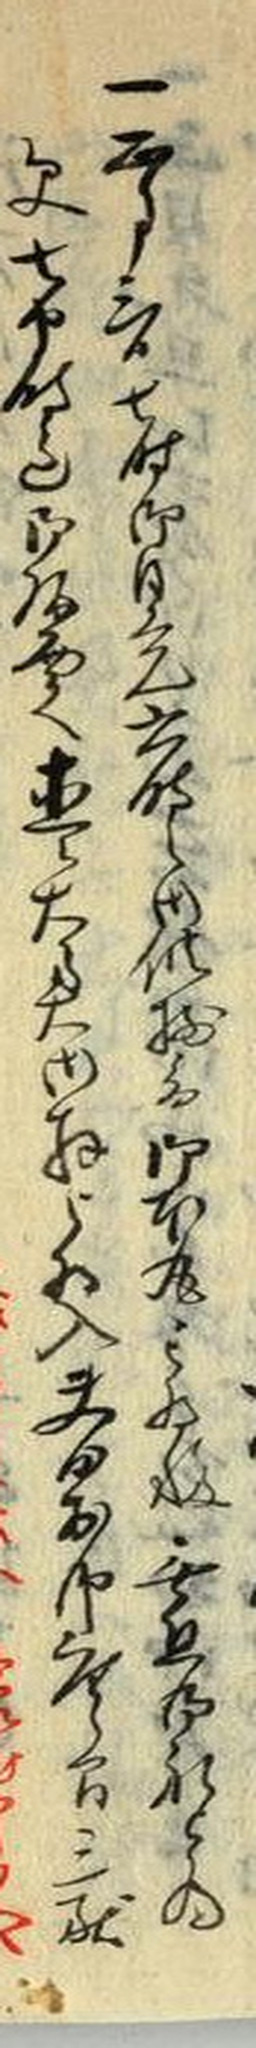受七半時過御帰殿直ニ大奥御拝被為入夫ゟ於御座之間三献
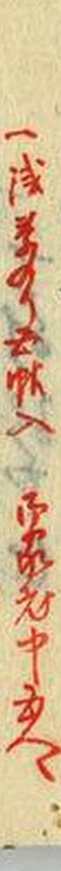一浅草のり五帖入御家老中五人へ
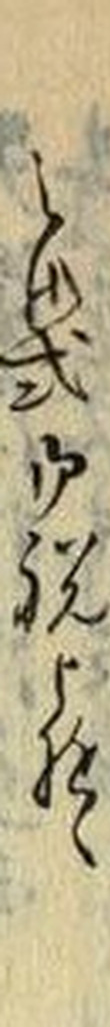之御式御祝被遊候
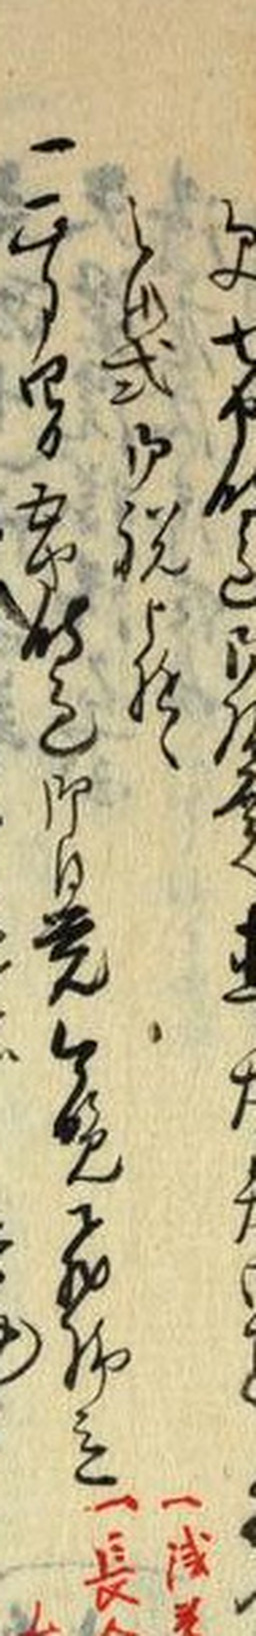一正月四日五半時過御目覚今晩飛脚立
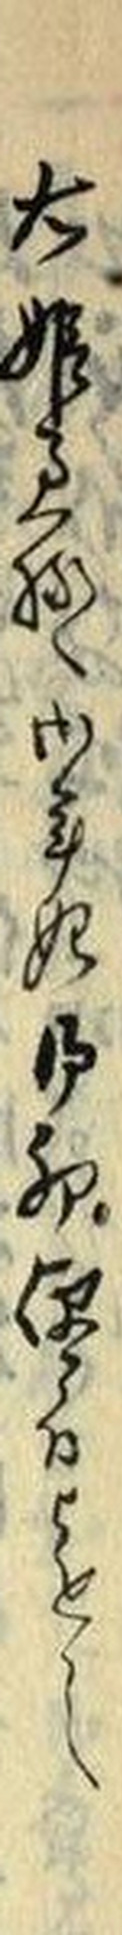右姫君様へ御年始御初便ニ付被進之
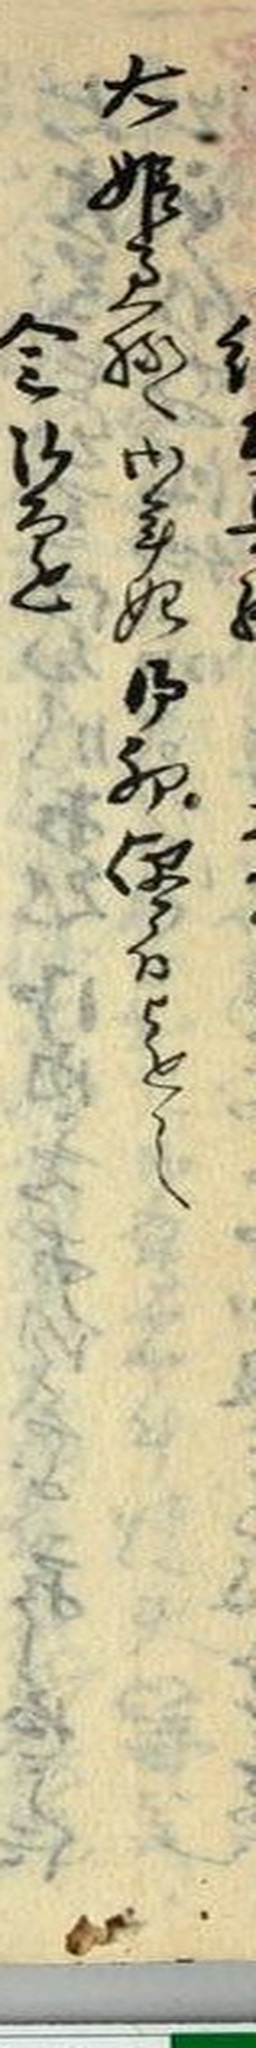金弐百疋
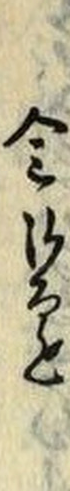金弐百疋
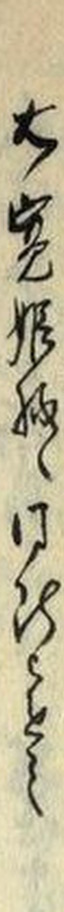右寛姫様へ同断被進之
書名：少傅日録抄（斉承付側向頭取日記、在国）
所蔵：福井県文書館 Fukui Prefectural Archives
